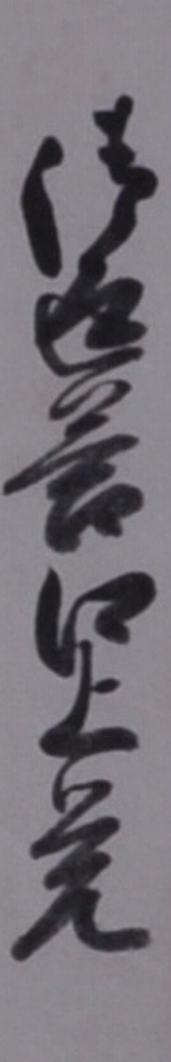御返答口上覚
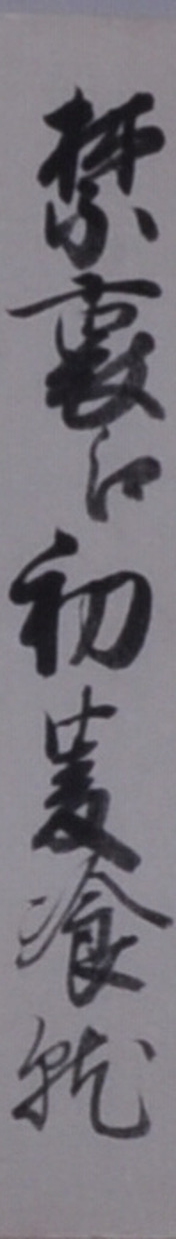禁裏え初菱喰就
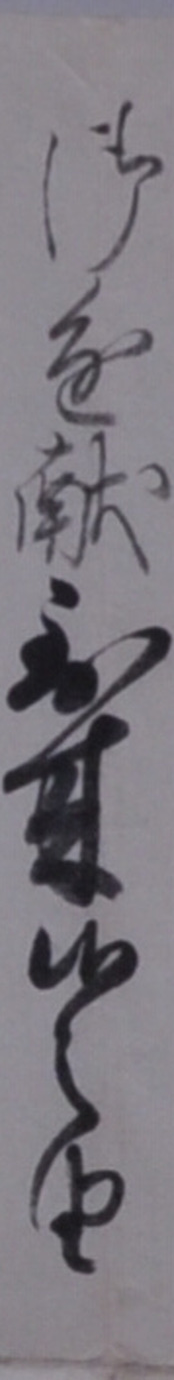御進献到来候之由
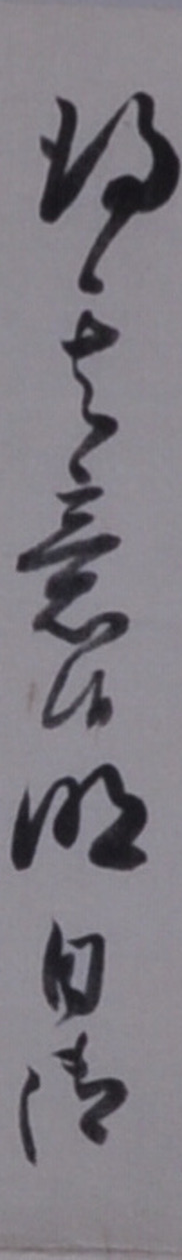得其意候明日御
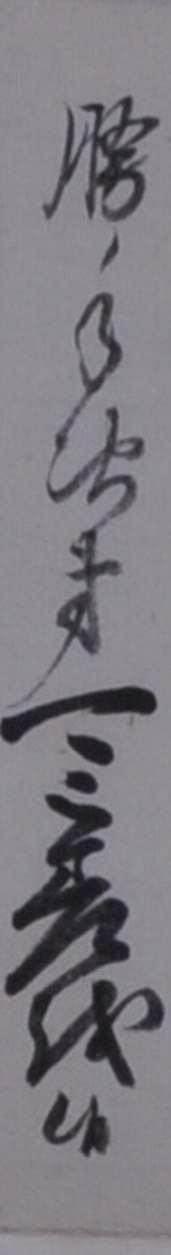勝手次第可被差越候
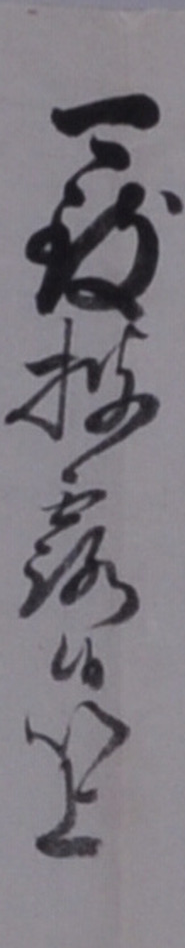可致披露候以上
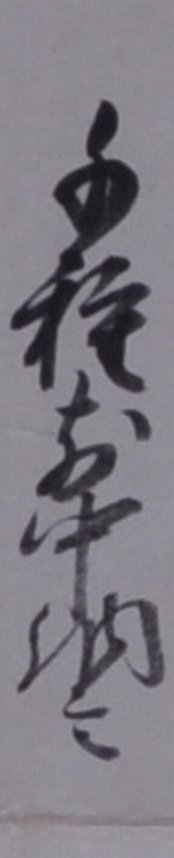千種前中納言
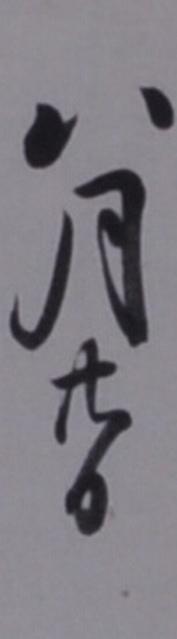八月廿日
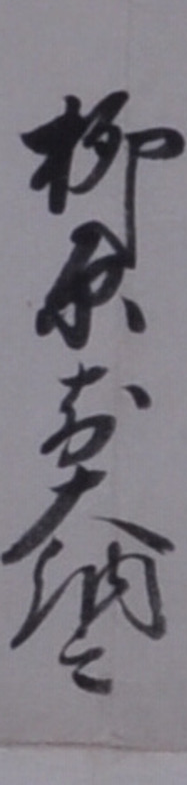柳原前大納言
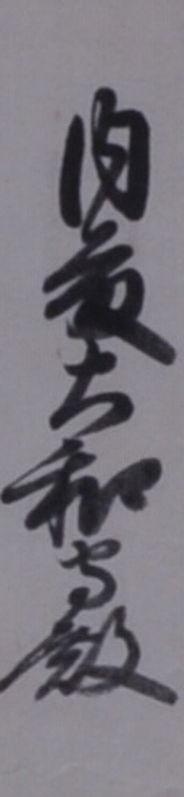内藤大和守殿
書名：御返答口上覚
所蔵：伊那市立高遠町図書館・合同会社AMANE
